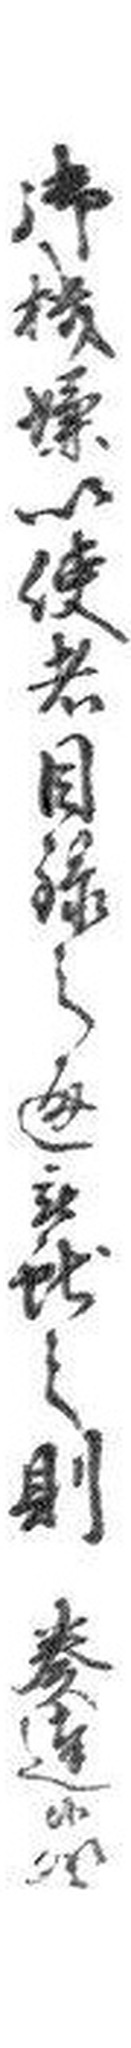御機嫌以使者目録之通被献之則奏達候処
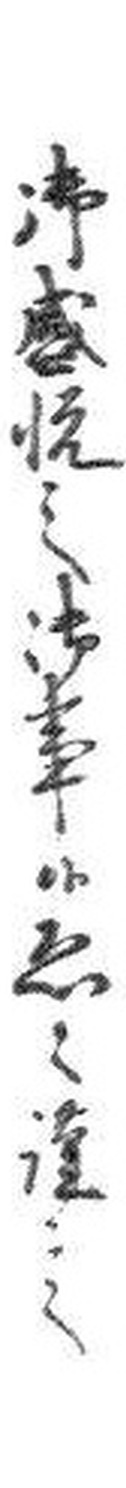御感悦之御事候恐々謹言
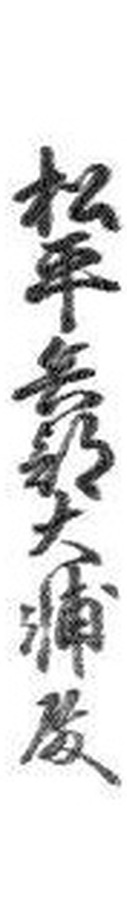松平兵部大輔殿
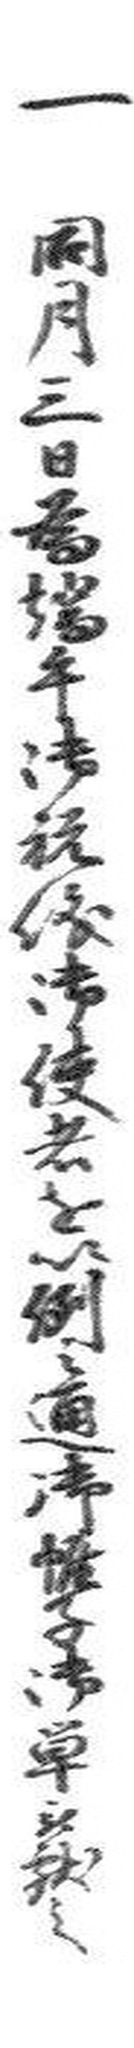一同月三日為端午御祝儀御使者を以例之通御帷子御単被献之
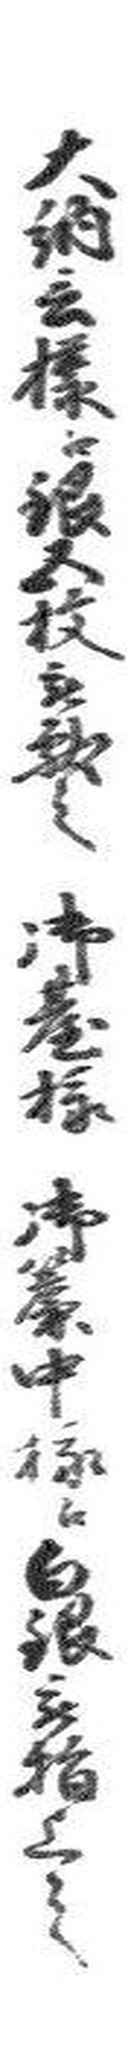大納言様江銀五枚被献之御台様御簾中様江白銀被指上之
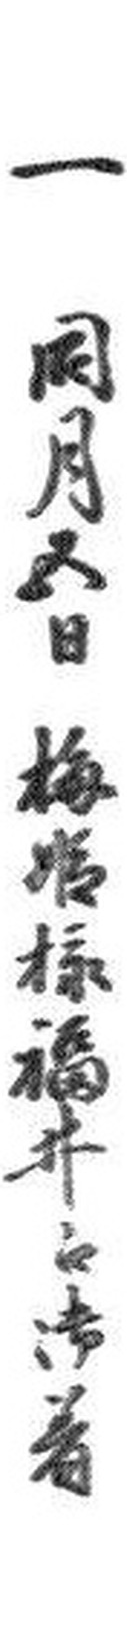一同月五日梅姫様福井江御着
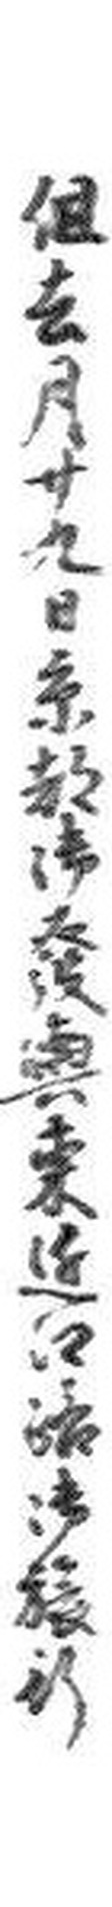但去月廿九日京都御発輿東近江路御旅行

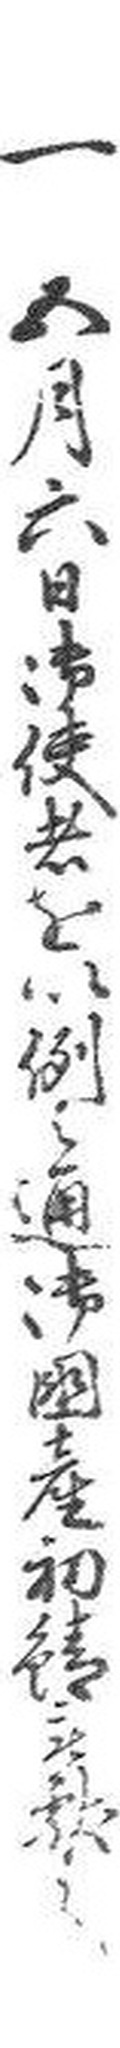一五月六日御使者を以例之通御国産初鯖被献之
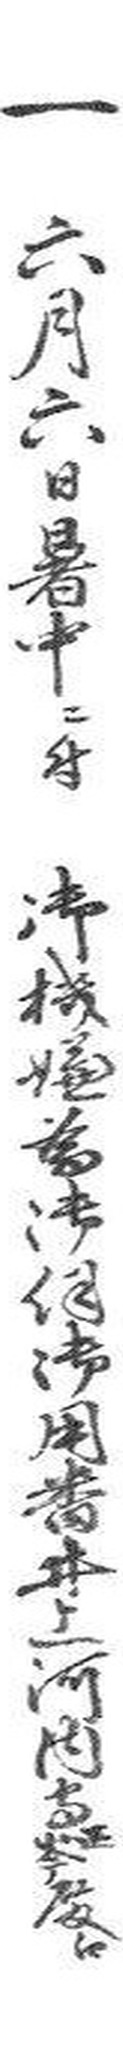一六月六日暑中ニ付御機嫌為御伺御用番井上河内守正岑殿江
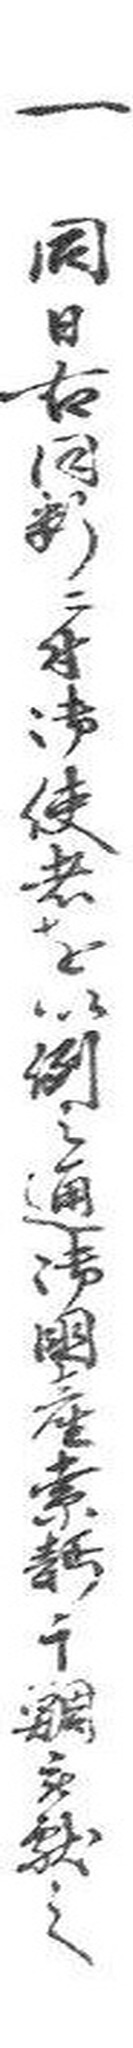一同日右同断ニ付御使者を以例之通御国産索麺干鯛被献之
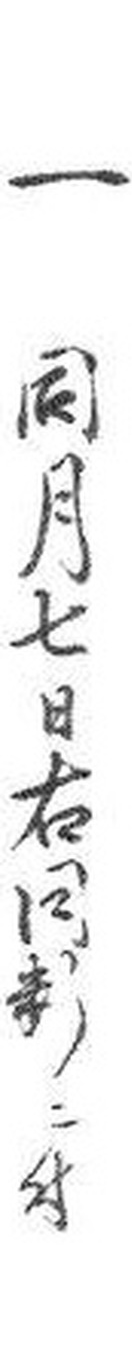一同月七日右同断ニ付
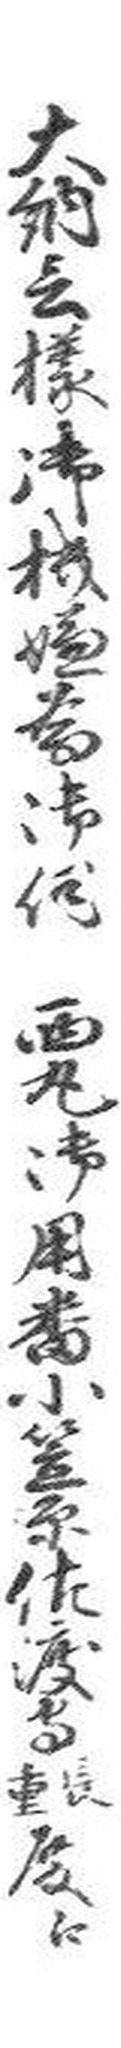大納言様御機嫌為御伺西丸御用番小笠原佐渡守長重殿江
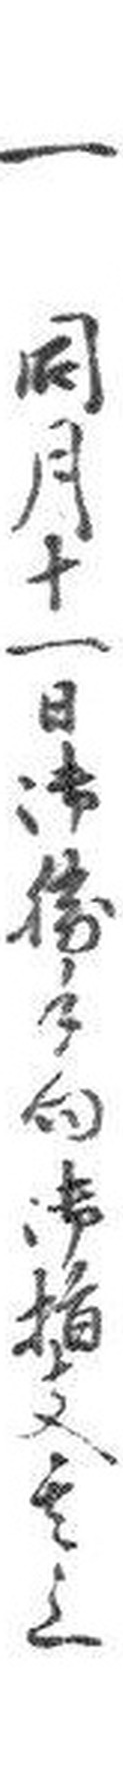一同月十一日御勝手向御指支其上
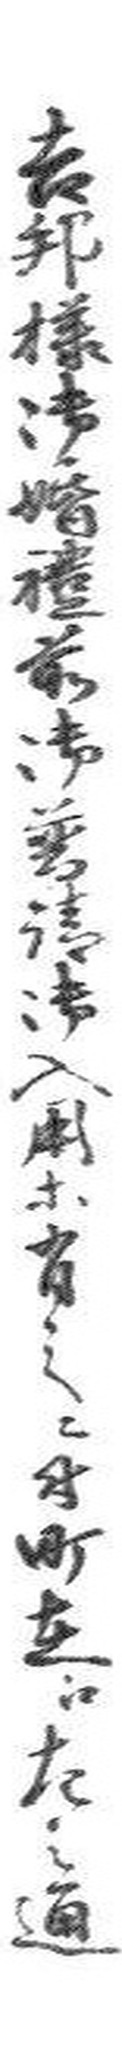吉邦様御婚礼前御普請御入用等有之ニ付町在江左之通
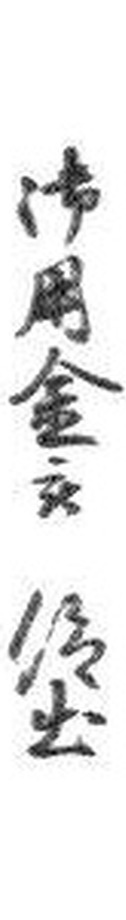御用金被仰出
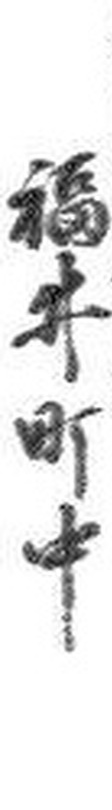福井町中
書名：家譜 二十四 吉品公 従宝永三年到同五年
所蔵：福井県文書館 Fukui Prefectural Archives
